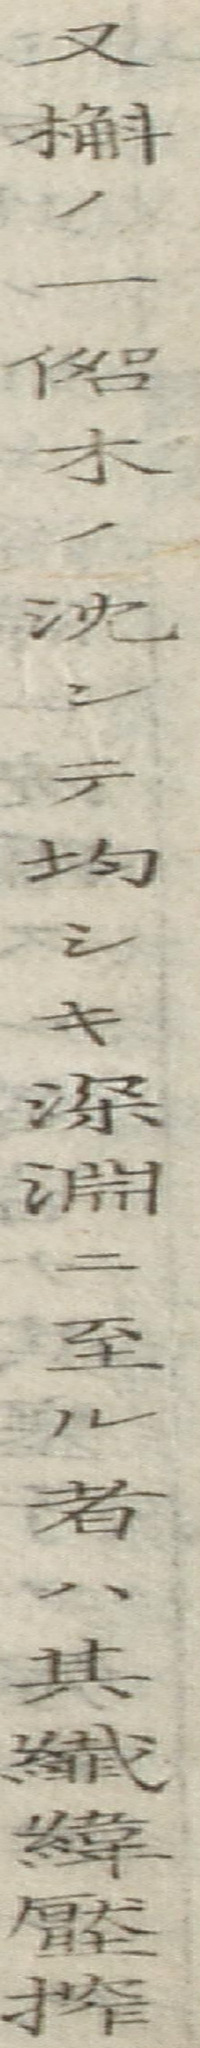又槲ノ一木ノ沈ンテ均ンキ深淵ニ至ル者ハ其繊緯圧搾
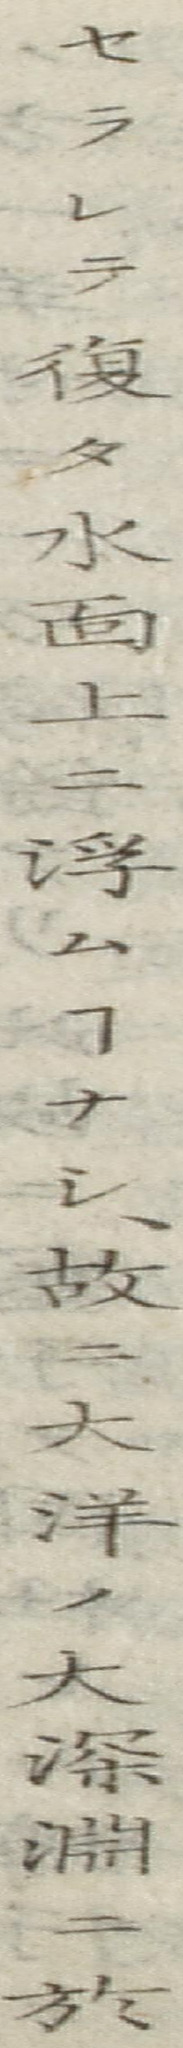セラレテ復タ水面上ニ浮ムヿナシ、故ニ大洋ノ大深淵ニ於
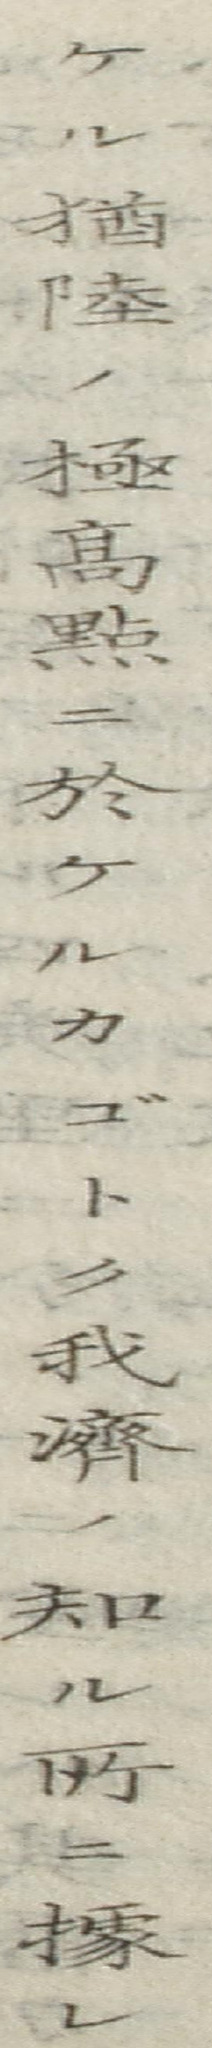ケル猶陸ノ極高点ニ於ケルカゴトク我儕ノ知ル所ニ據レ
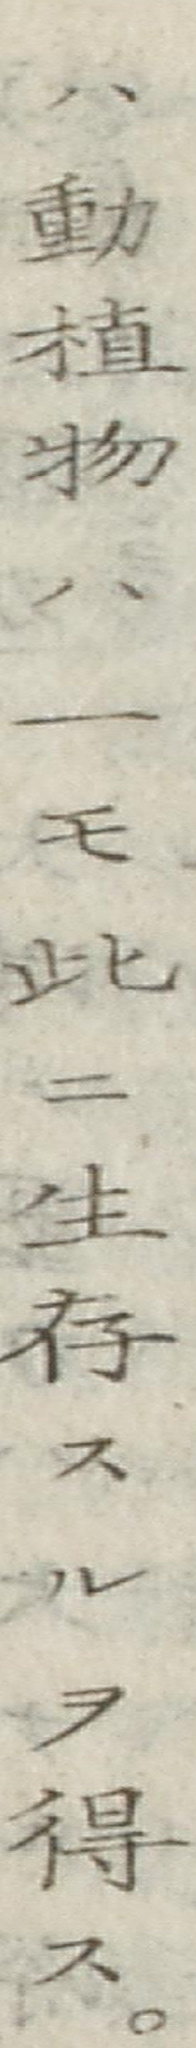ハ動植物ハ一モ此ニ生存スルヲ得ス。
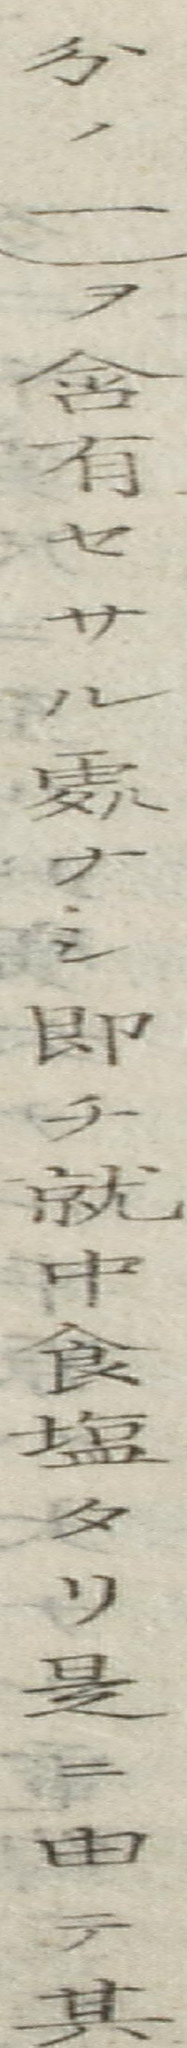分ノ一）ヲ含有セサル處ナシ即チ就中食塩タリ是ニ由テ其
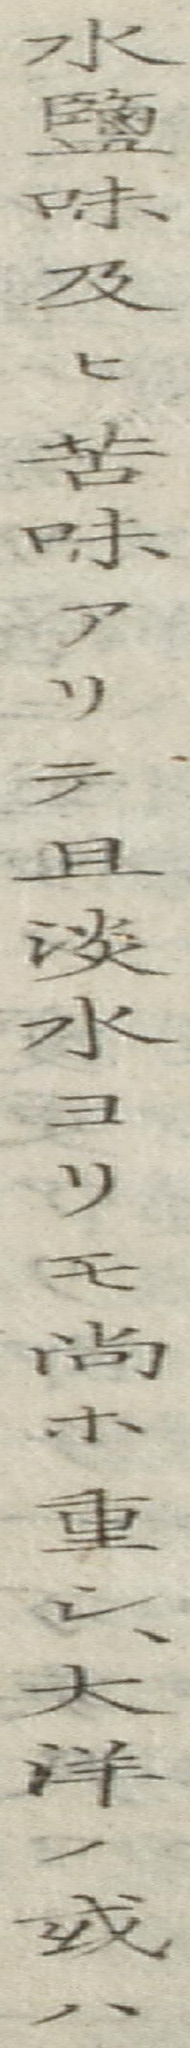水塩味及ヒ苦味アリテ且淡水ヨリモ尚ホ重シ、大洋ノ或ハ
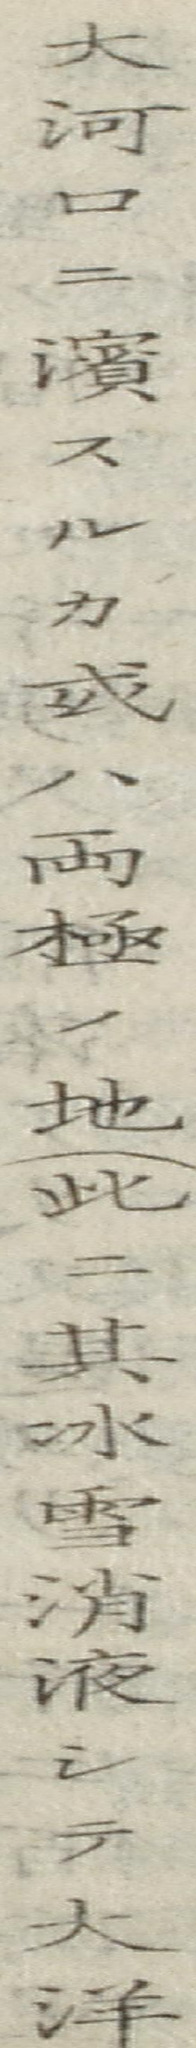大河口ニ浜スルカ或ハ両極ノ地（此ニ其氷雪消液シテ大洋
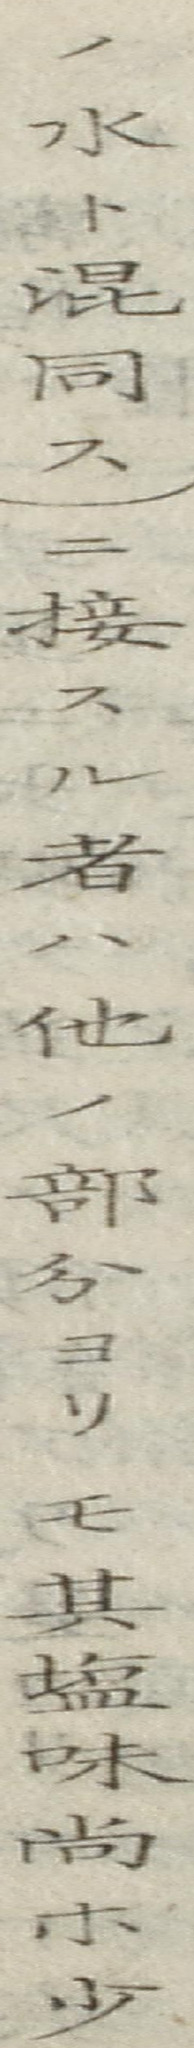ノ水ト混同ス）ニ接スル者ハ他ノ部分ヨリモ其塩味尚ホ少
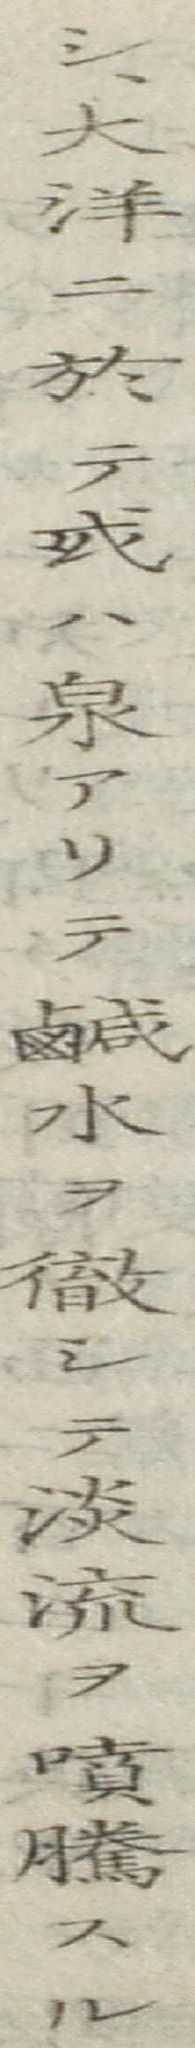シ、大洋ニ於テ或ハ泉アリテ鹹水ヲ徹シテ淡流ヲ噴騰スル
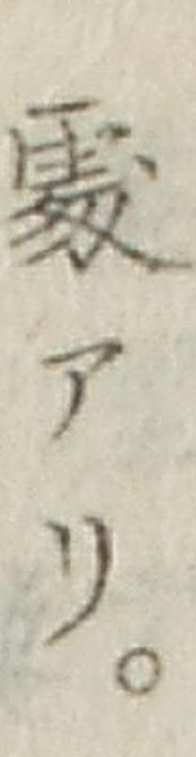處アリ。
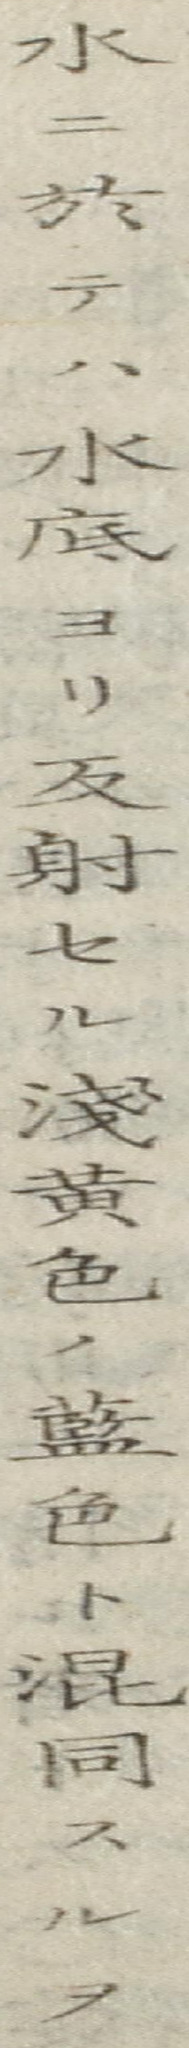水ニ於テハ水底ヨリ反射セル浅黄色ノ藍色ト混同スルヲ
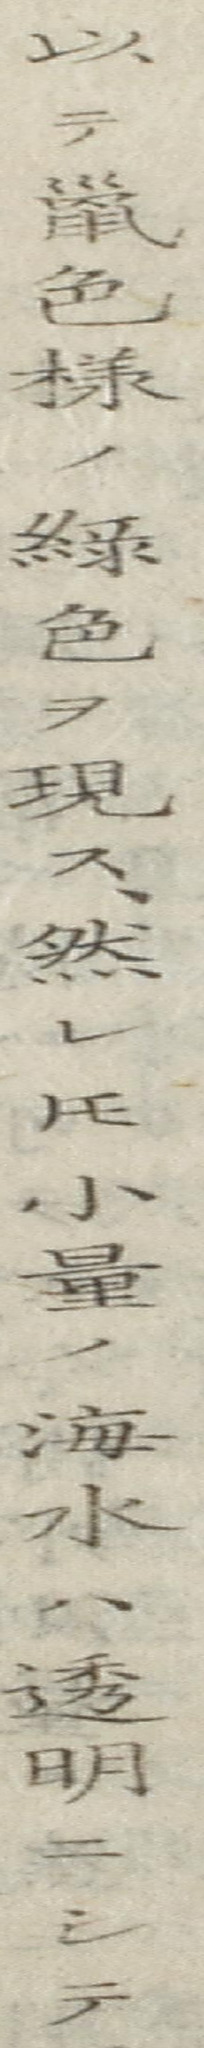以テ鼠色様ノ緑色ヲ現ス、然レトモ小量ノ海水ハ透明ニシテ、
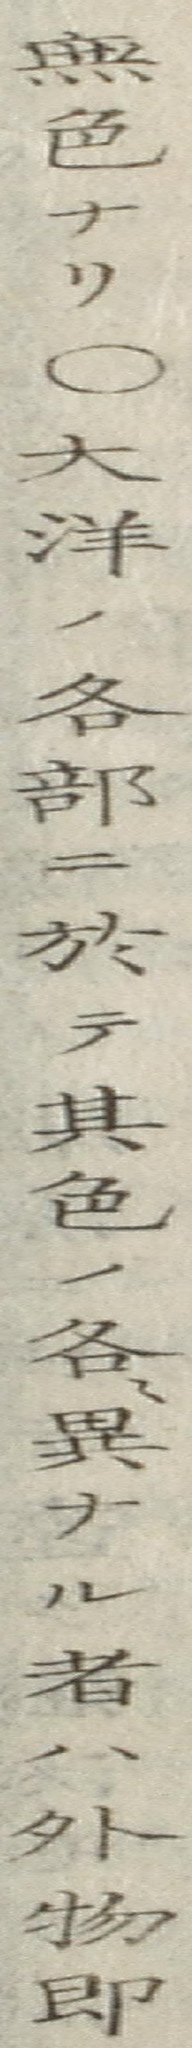無色ナリ○大洋ノ各部ニ於テ其色ノ各々異ナル者ハ外物即
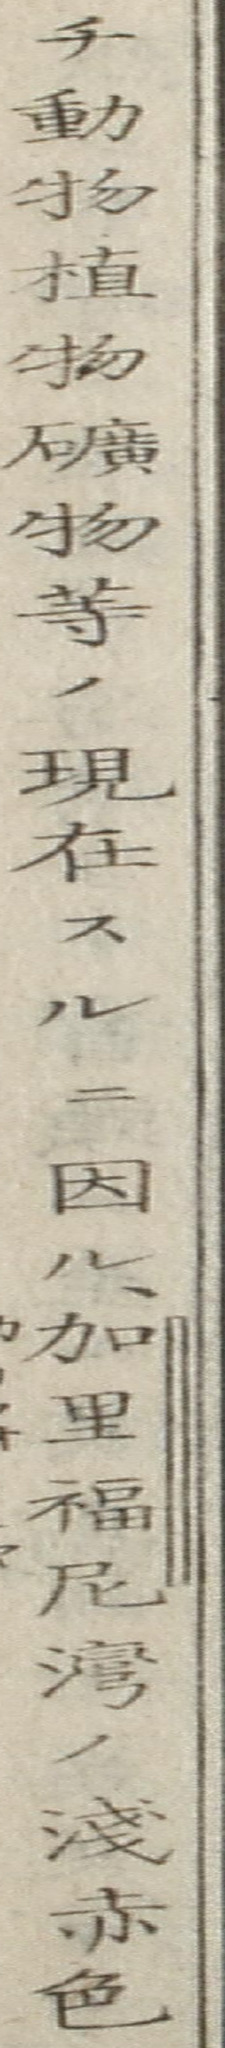チ動物植物鉱物等ノ現在スルニ因ル、加里福尼湾ノ浅赤色
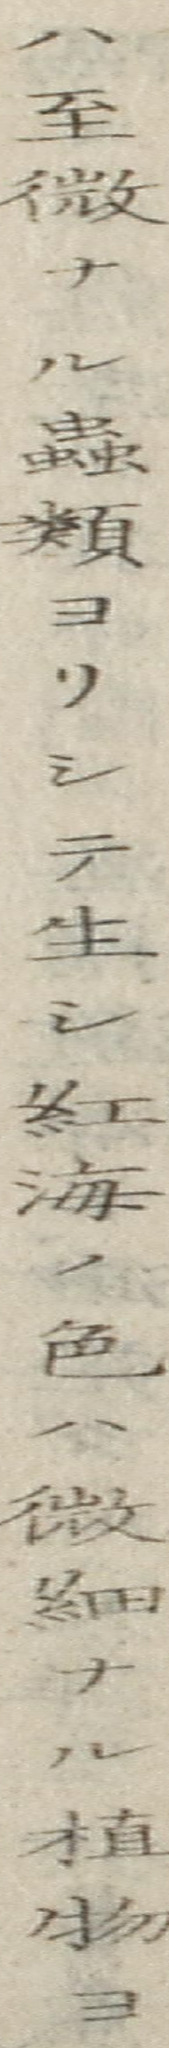ハ至微ナル蟲類ヨリシテ生シ紅海ノ色ハ微細ナル植物ヨ
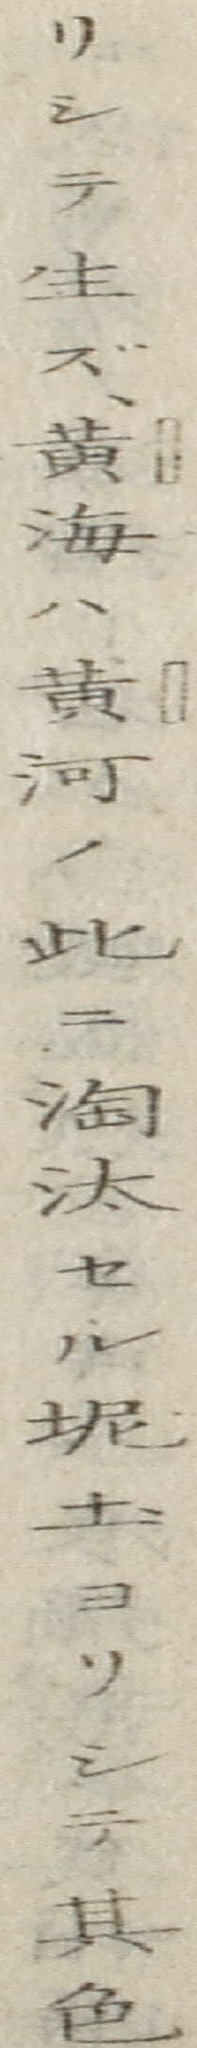リシテ生ズ、黄海ノ黄河ノ此ニ淘汰セル坭土ヨリシテ其色
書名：地形論　巻二
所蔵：東京大学地震研究所図書室 Earthquake Research Institute Library, The University of Tokyo, JAPAN
